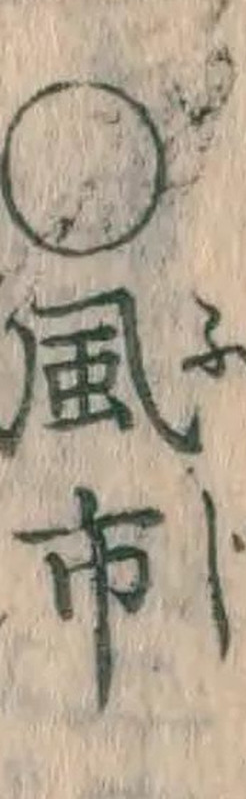○風市
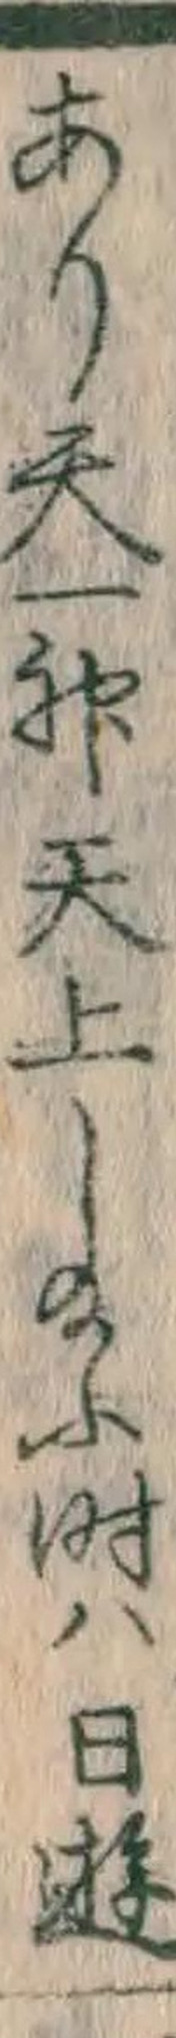あり天一神天上し給ふ時は日遊
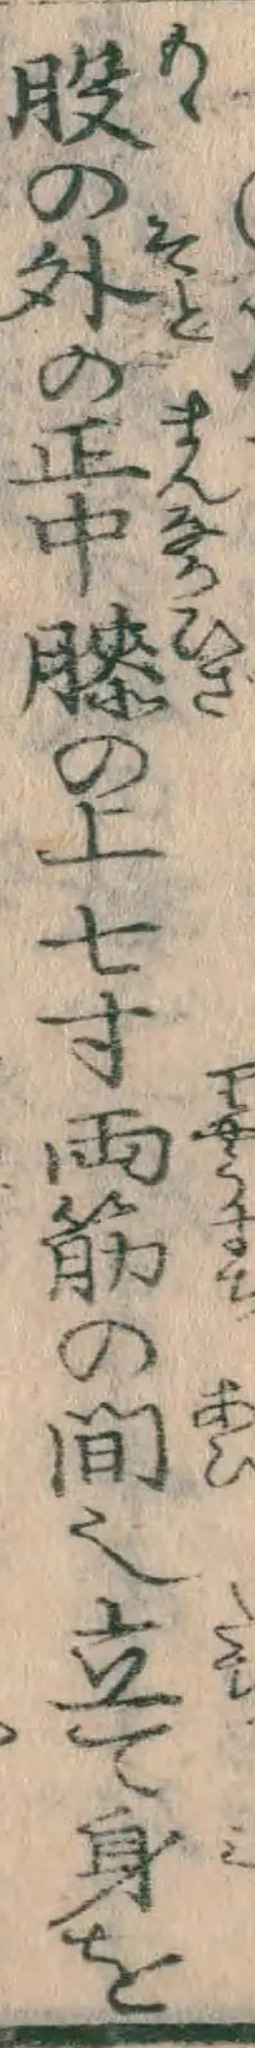股の外の正中膝の上七寸両筋の間也立て身を
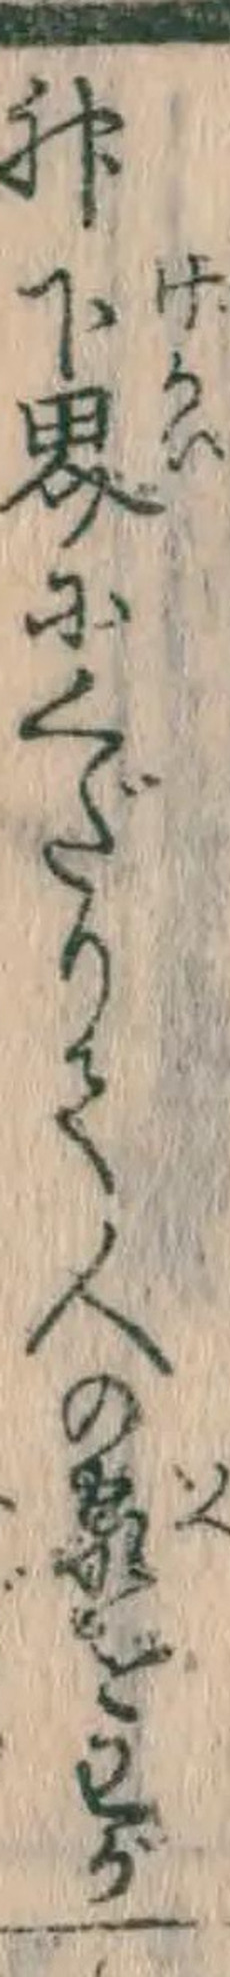神下界にくだりて人の家をわが
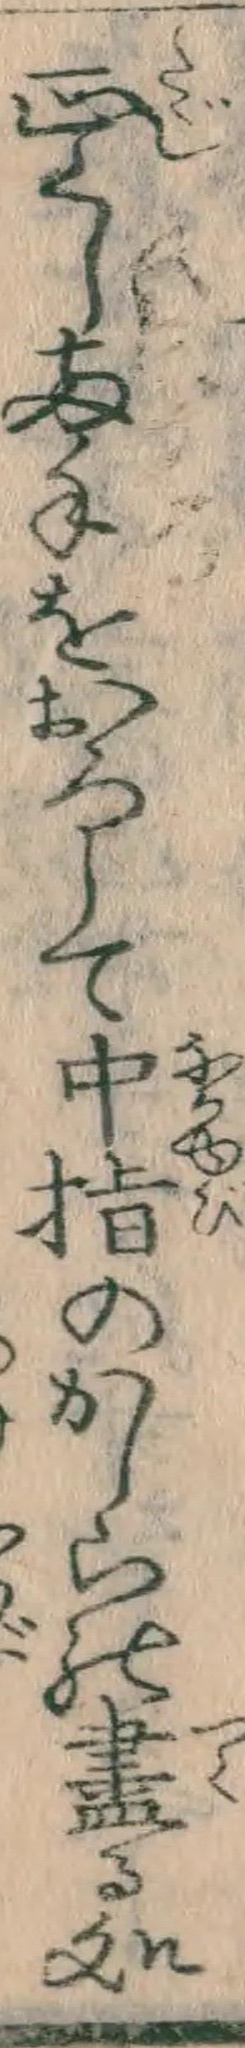正くし両手をおろして中指のかしらの尽る処
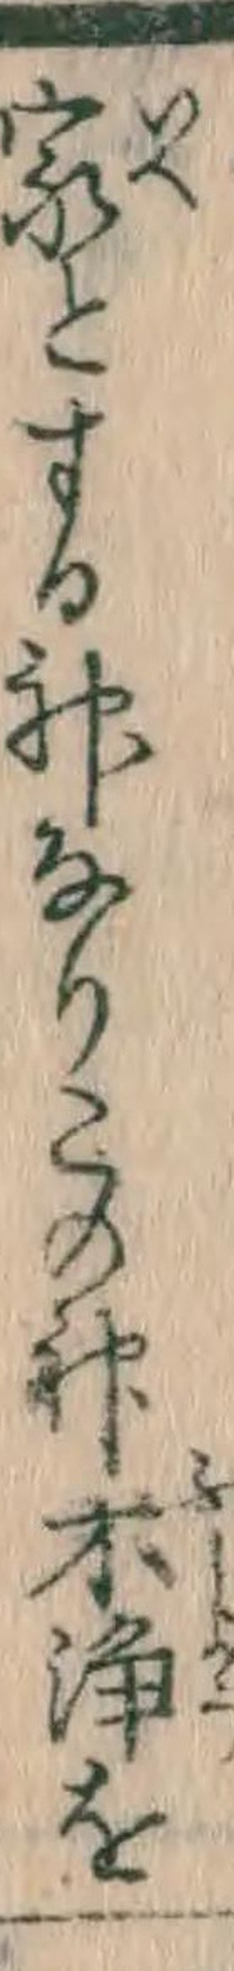家とする神なりこの神不浄を
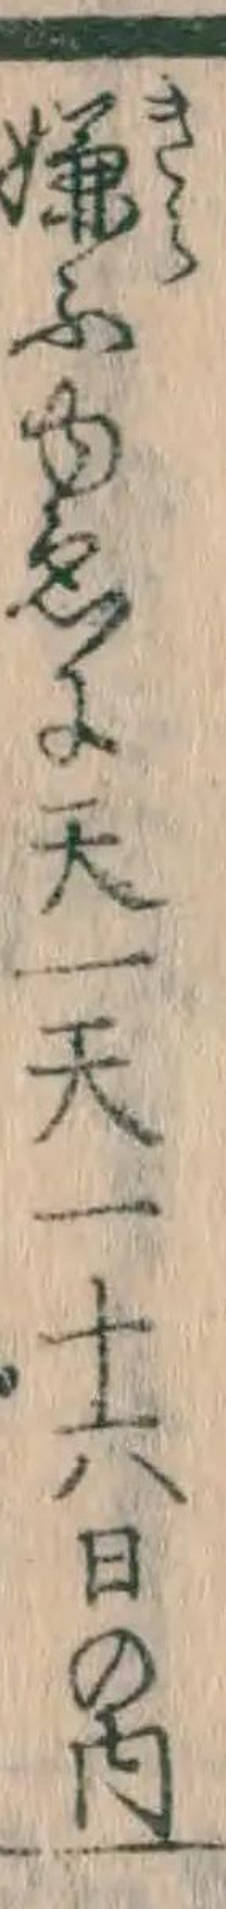嫌ふゆゑに天一天一十六日の内
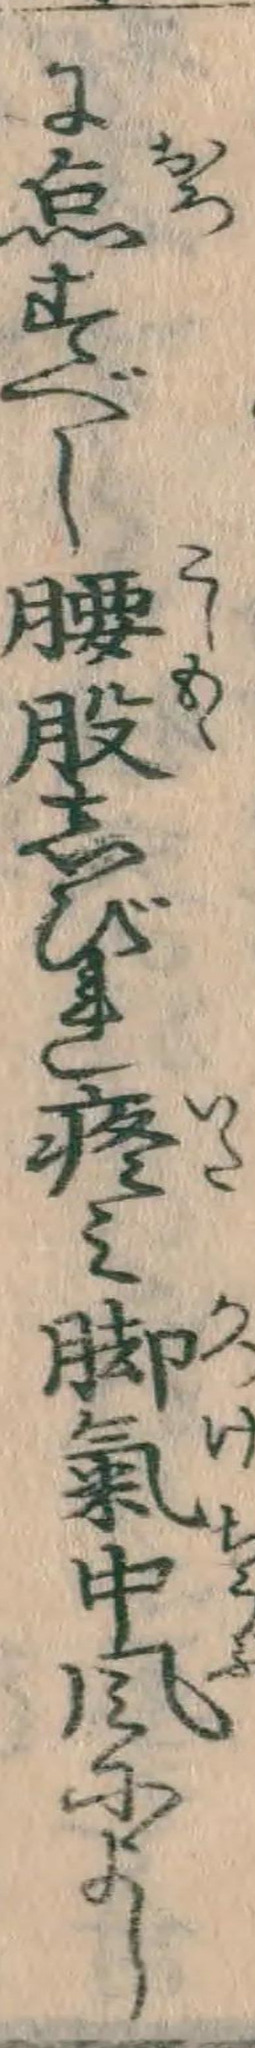に点すべし腰股しびれ疼み脚気中風によし
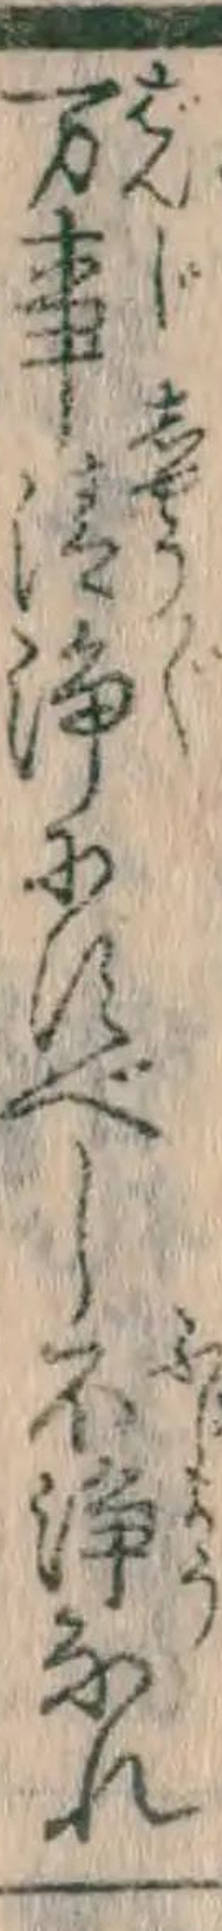万事清浄にすべし不浄なれ
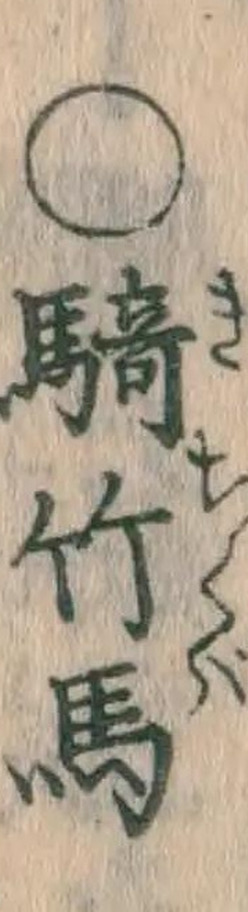○騎竹馬
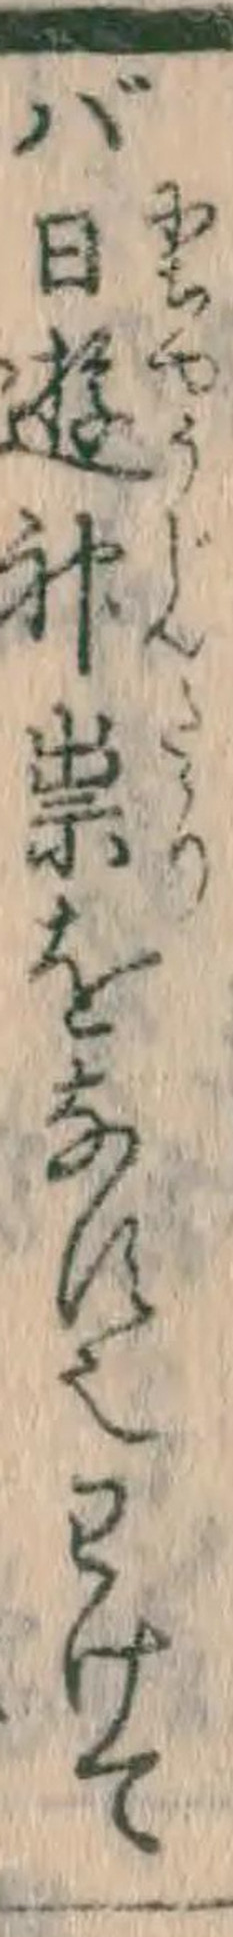ば日遊神祟をなす也わけて
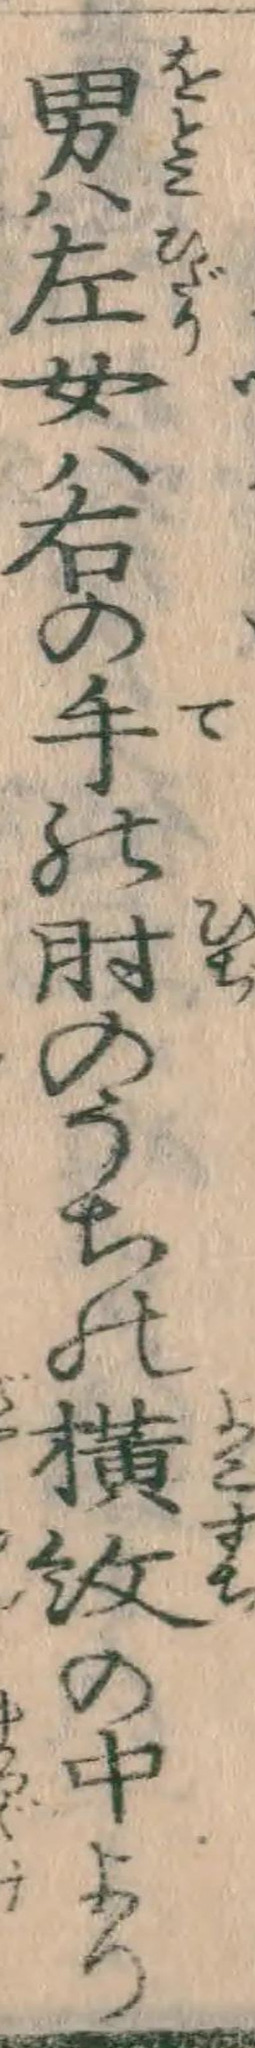男は左女は右の手の肘のうちの横紋の中より
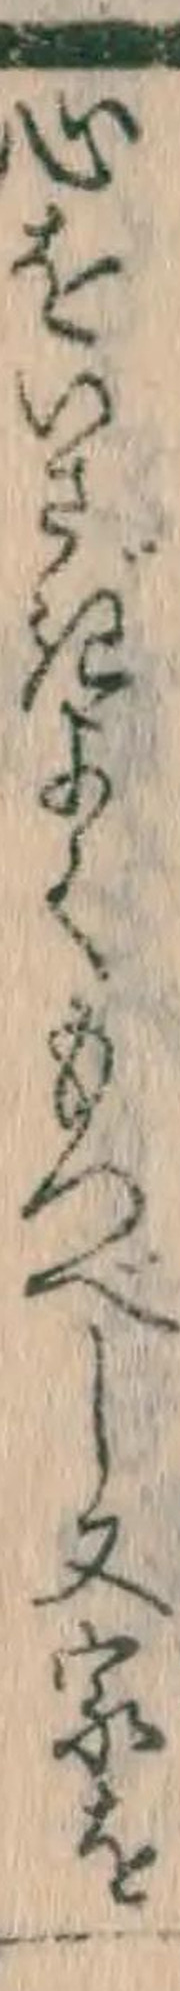心をいさぎよくもつべし又家を
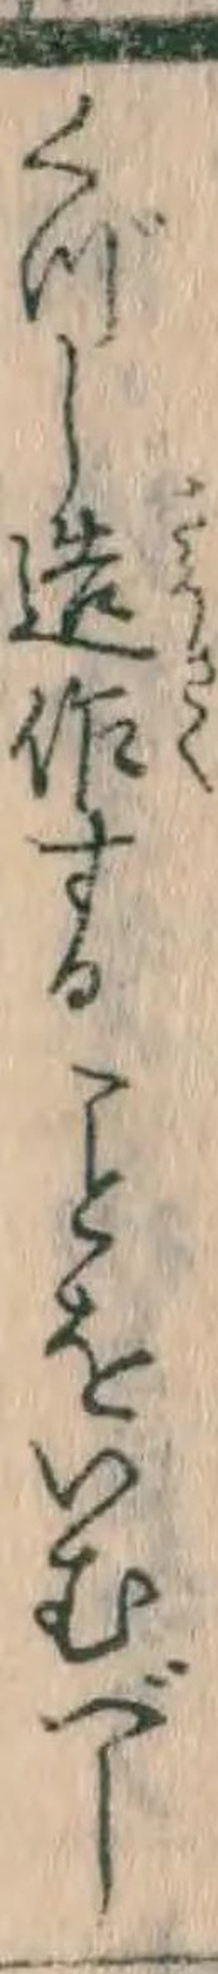くづし造作することをいむべし
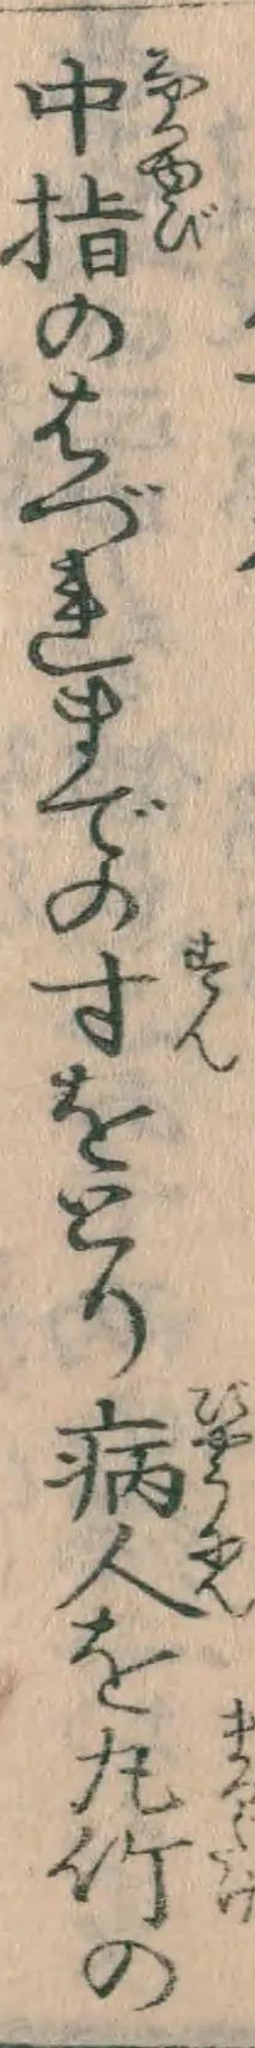中指のはづれまでの寸をとり病人を丸竹の
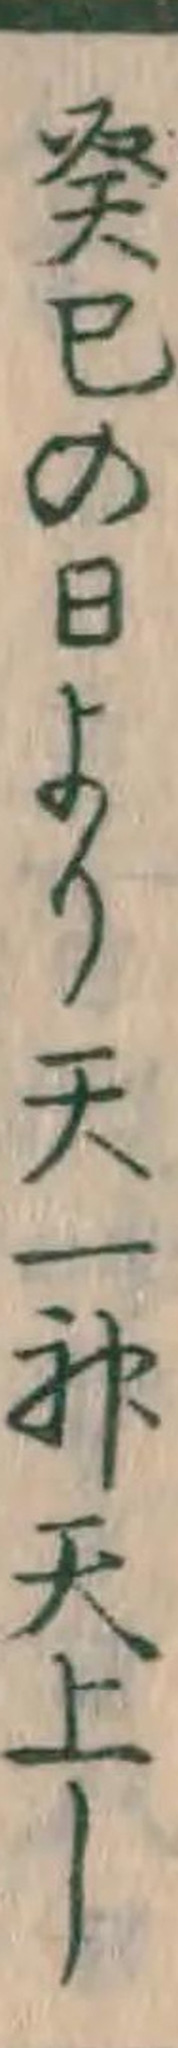癸巳の日より天一神天上し
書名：広益秘事大全 3巻. [4]
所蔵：国立国会図書館 National Diet Library, JAPAN
